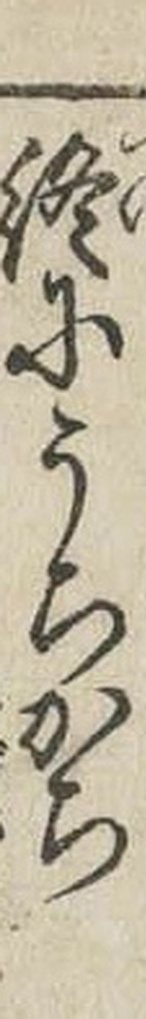終にうちかち
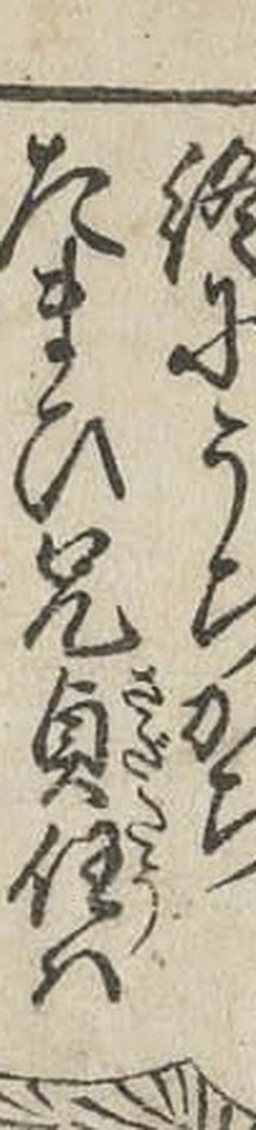たまひ兄貞任は
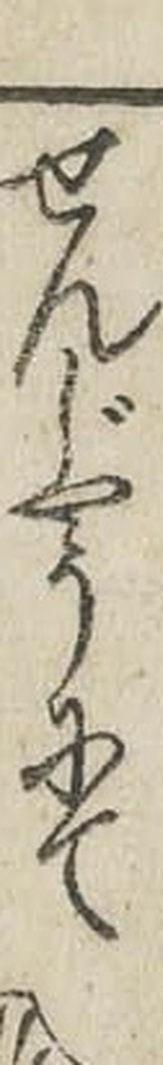せんじやうにて
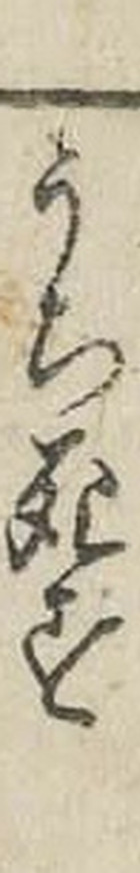うち死す
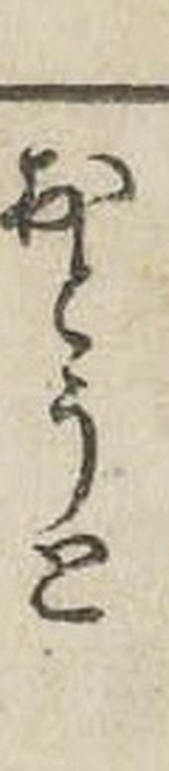おとうと
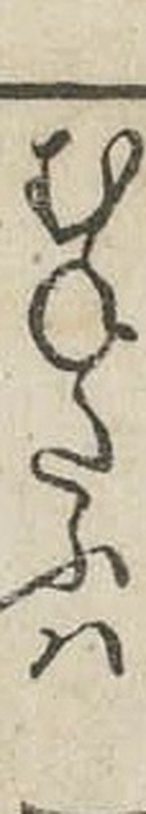むねたふは
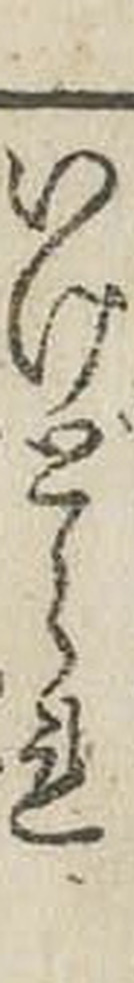いけどられ
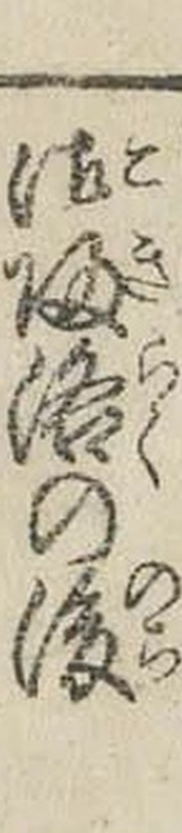御帰洛の後
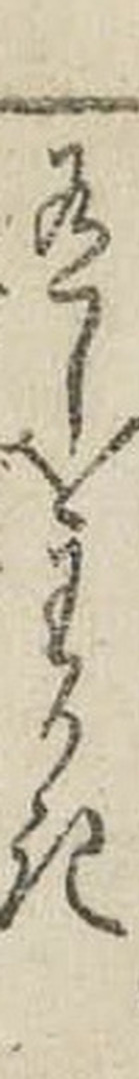有しをわかき
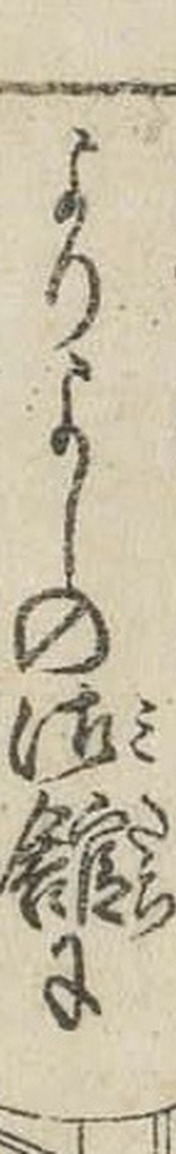よりよしの御館に
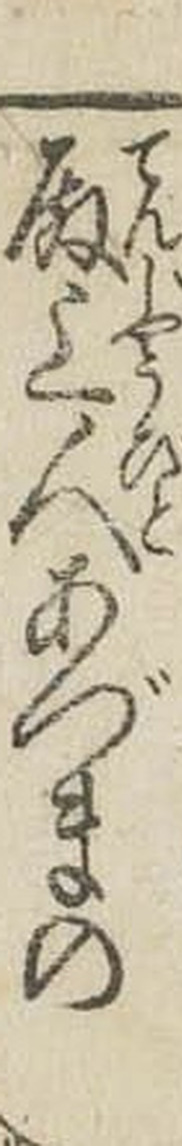殿上人あづまの
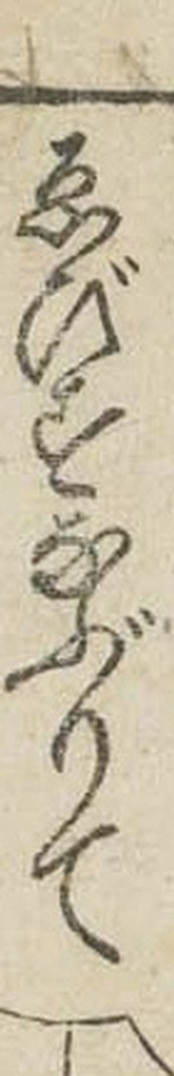ゑびすなぶりて
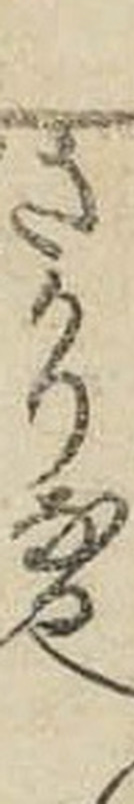さかりなる
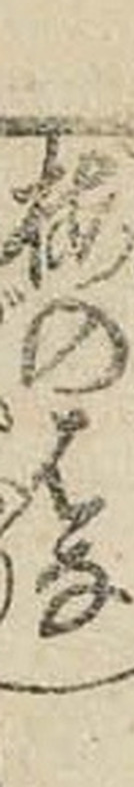梅のはな
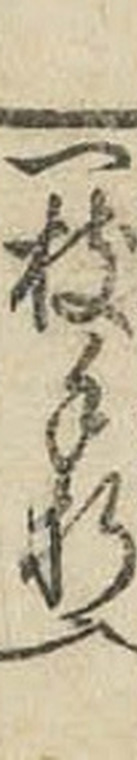一枝手折
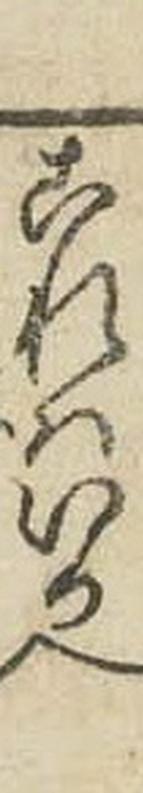これはいか
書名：絵本写宝袋 9巻 3之巻
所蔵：東京学芸大学教育コンテンツアーカイブ
